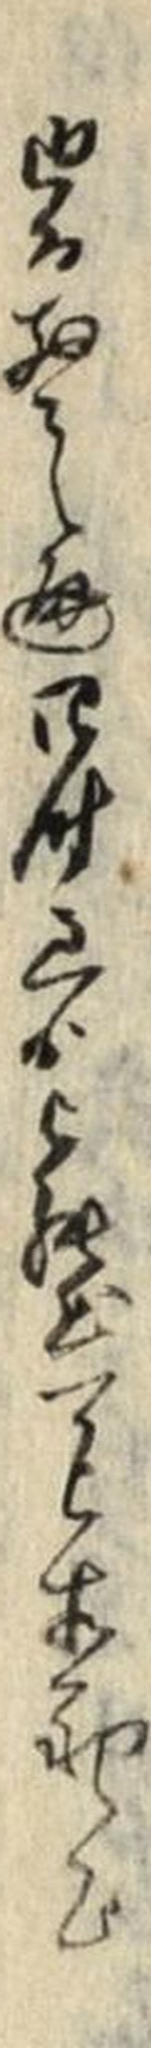追而前々之通四時過ゟ被罷出可被相勤候以上
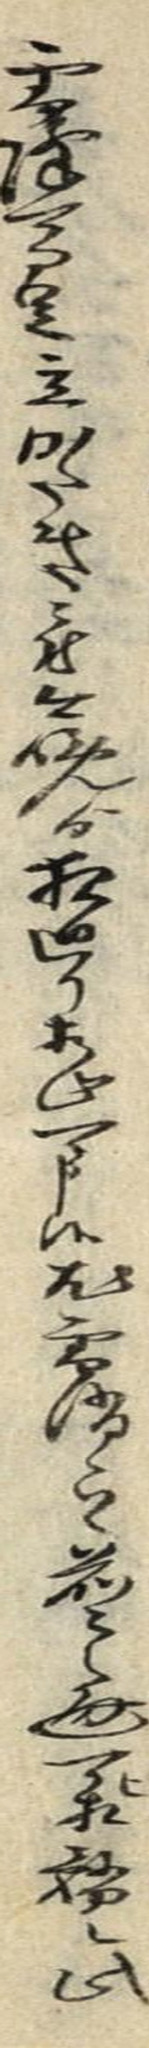雪深馬足立かたきに付今晩ゟ夜廻り相止可申候尤雪消候はゝ前々之通可被相務候此
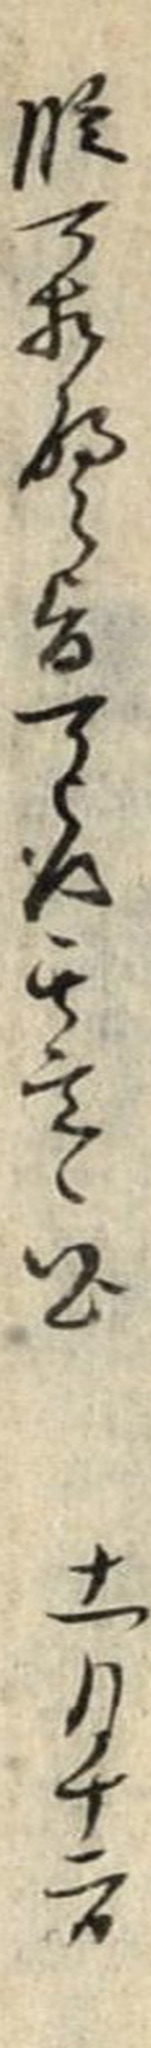段可相触候旨可被得其意候以上十一月十二日
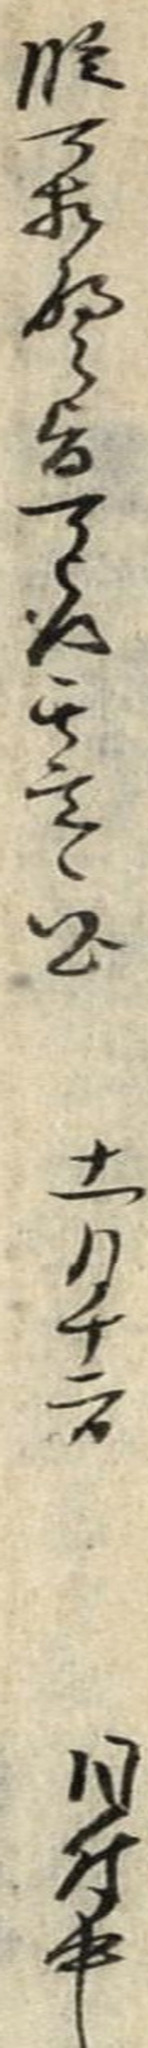段可相触候旨可被得其意候以上十一月十二日
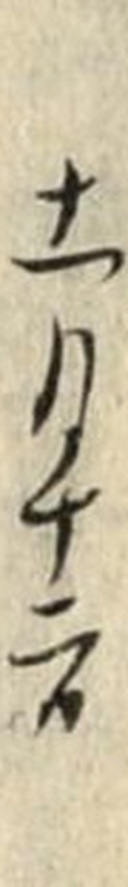十一月廿六日
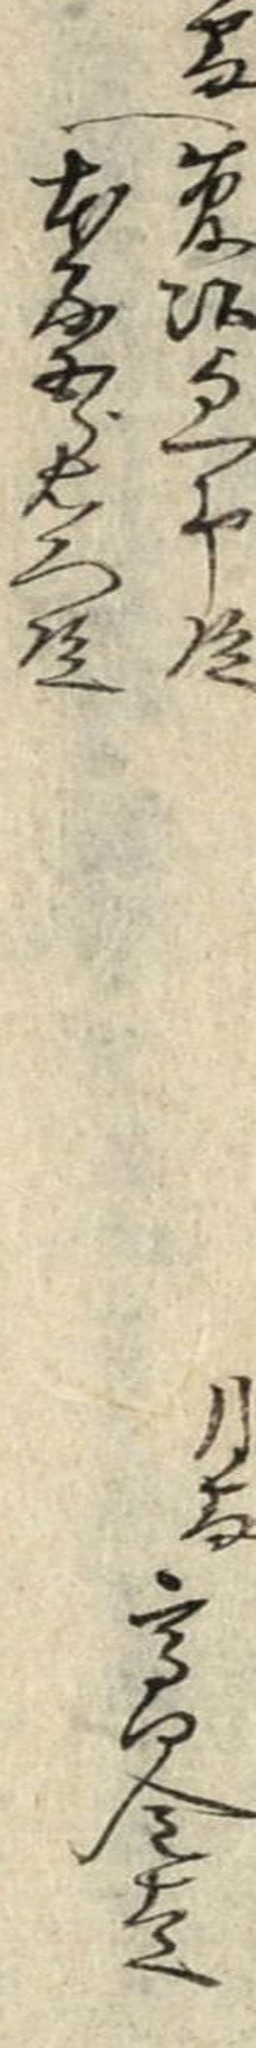本多五郎右衛門殿月番高田金太夫
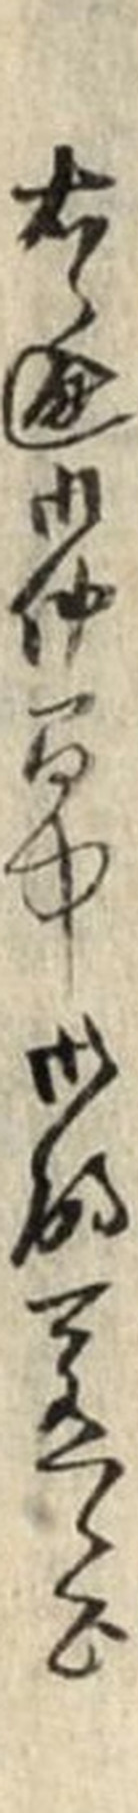右之通御仲間中御触可有候以上
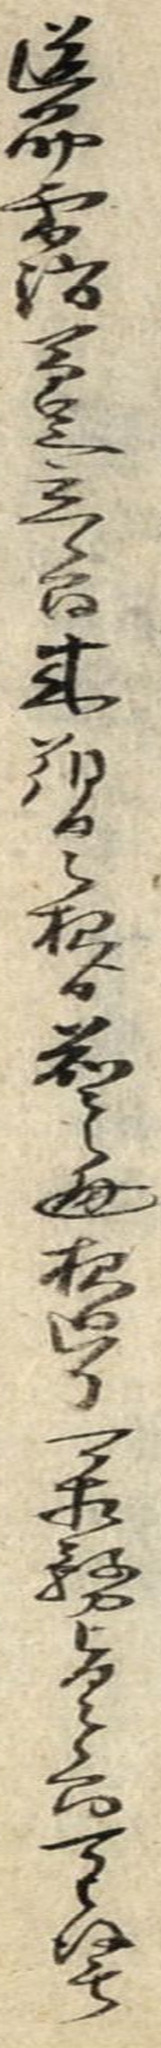道筋雪消馬足立候間来朔日之夜ゟ前々之通夜廻り可相務旨候間可被得其
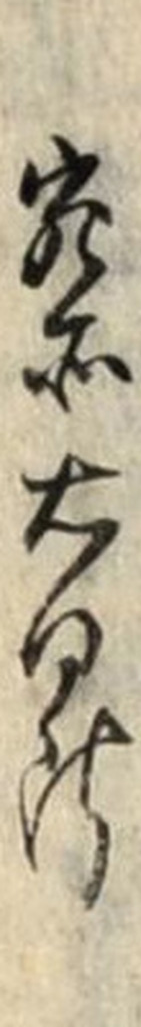宛所右同断
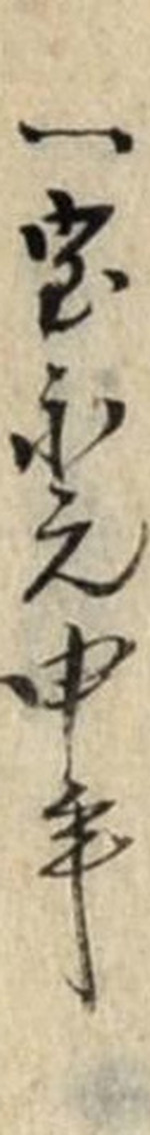一宝永元申年
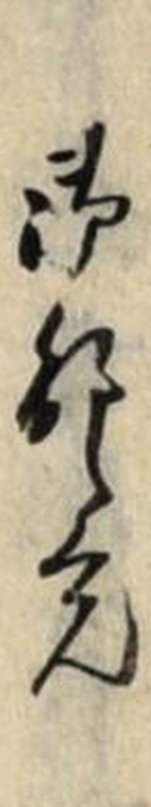御触之覚

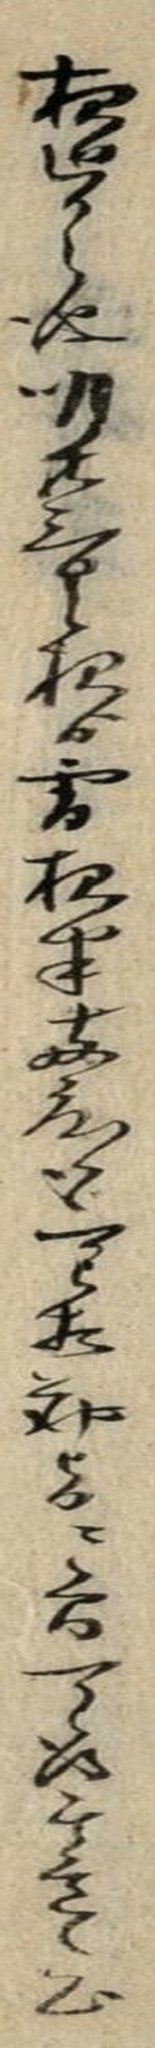夜廻り之儀明廿三日夜ゟ宵夜半両度つゝ可被相勤旨に候間可被得其意候以上
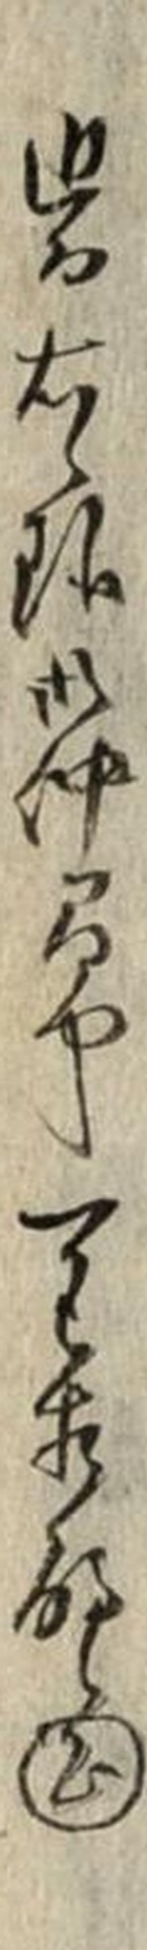追而右之趣御仲間中可被相触候以上
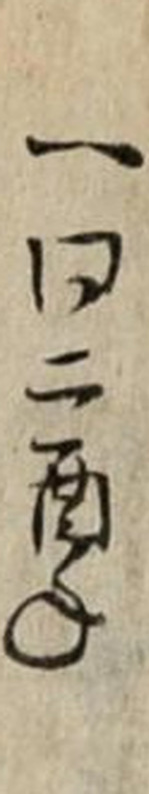一同二酉年
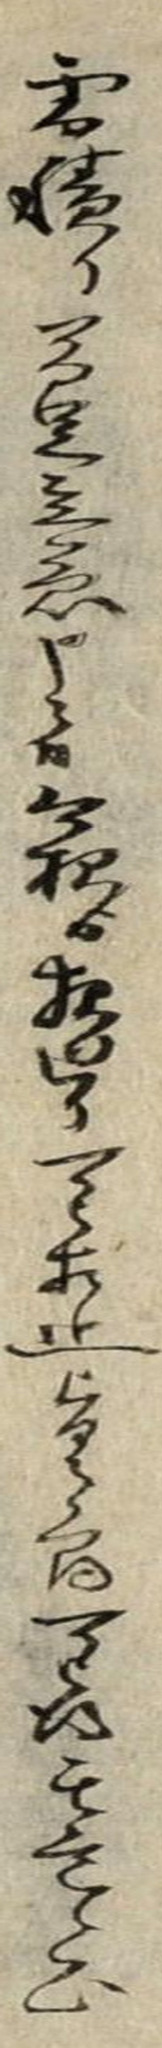雪積り馬足立兼申候に付今夜ゟ夜廻り可被相止旨に候間可被得其意候以上
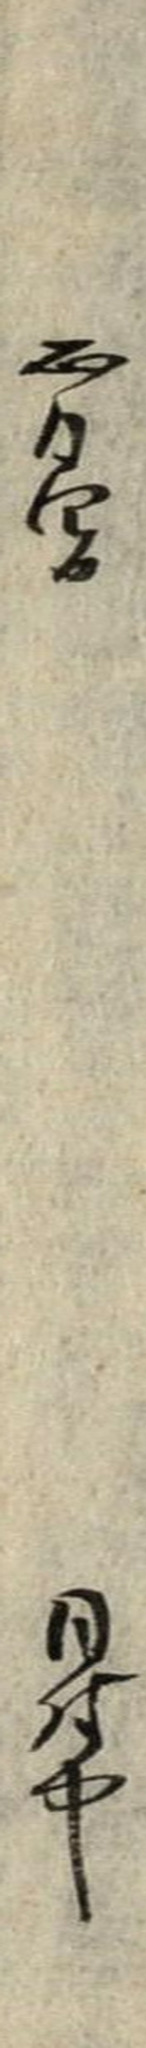正月四日目付中
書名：蒐輯之部
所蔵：福井県文書館 Fukui Prefectural Archives
